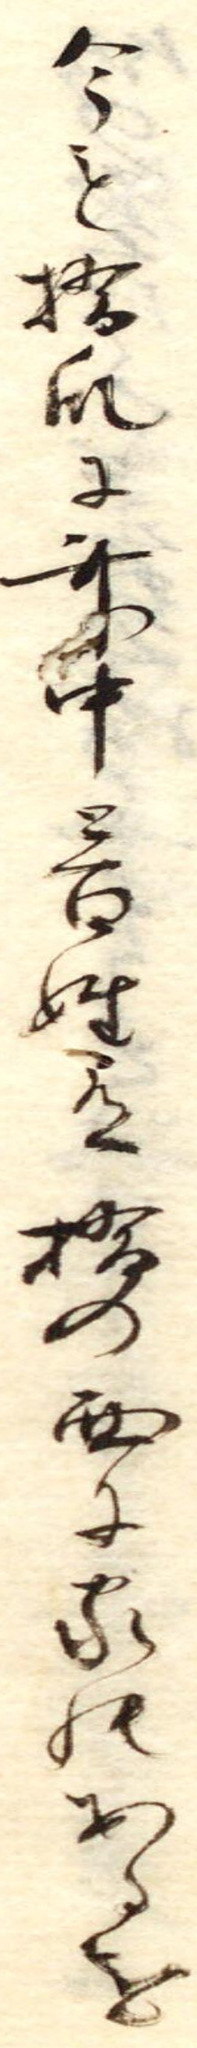今も橋爪に竹中と百姓有橋の西に家のあるを
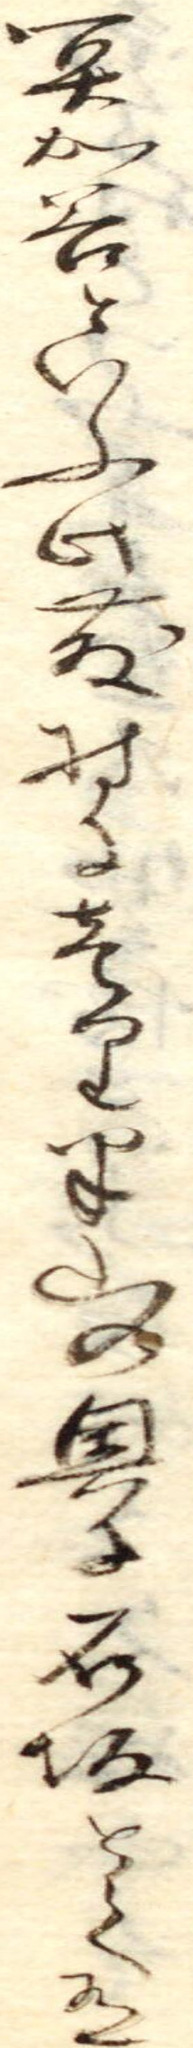冥加谷といふ此散村に壱里半山の奥に石坂とて有
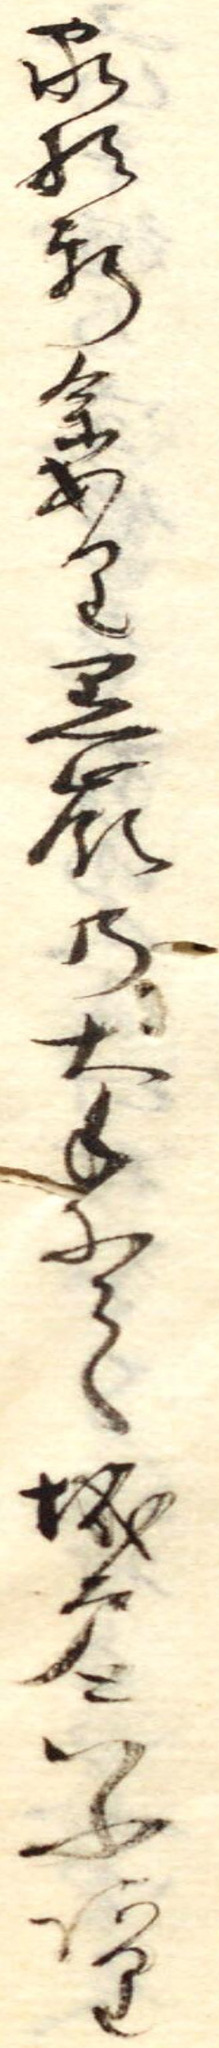家拾軒余あり黒嶺大手にて城戸といふあり
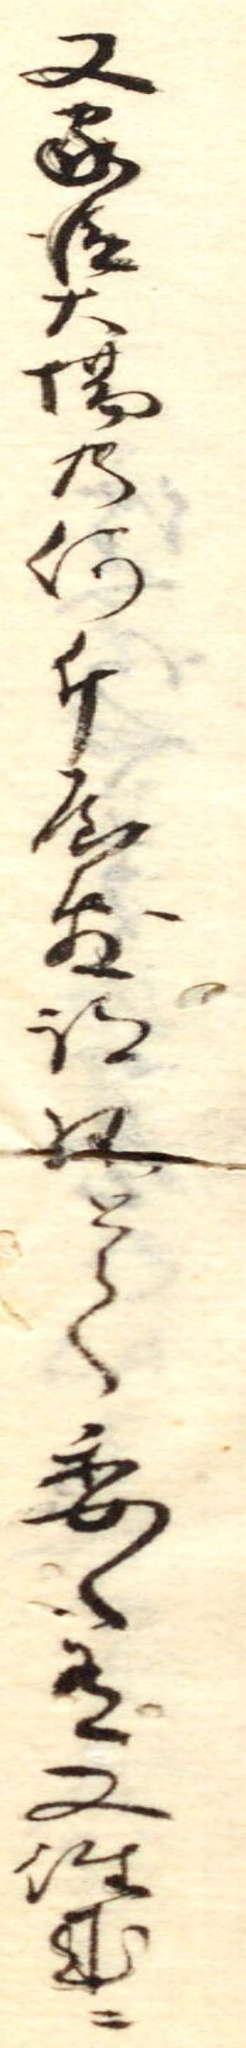又家跡大場の何ヶ屋敷跡抔とて委く有又往来に
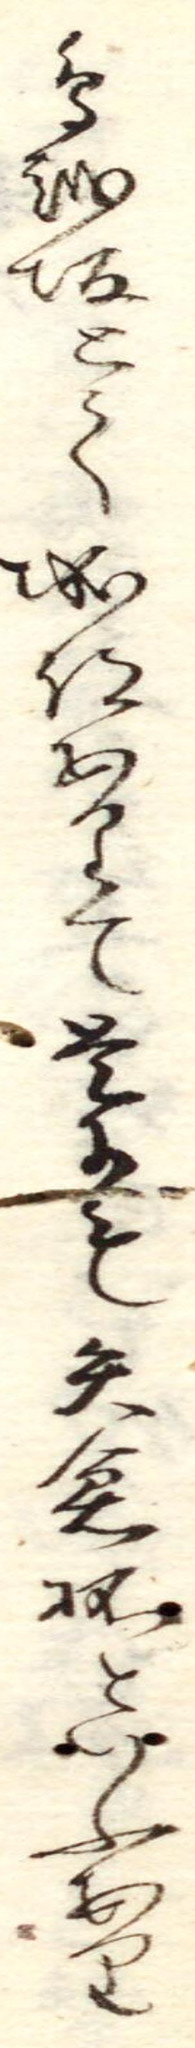鳥越坂とて城跡ありて是にも矢倉抔といふあり
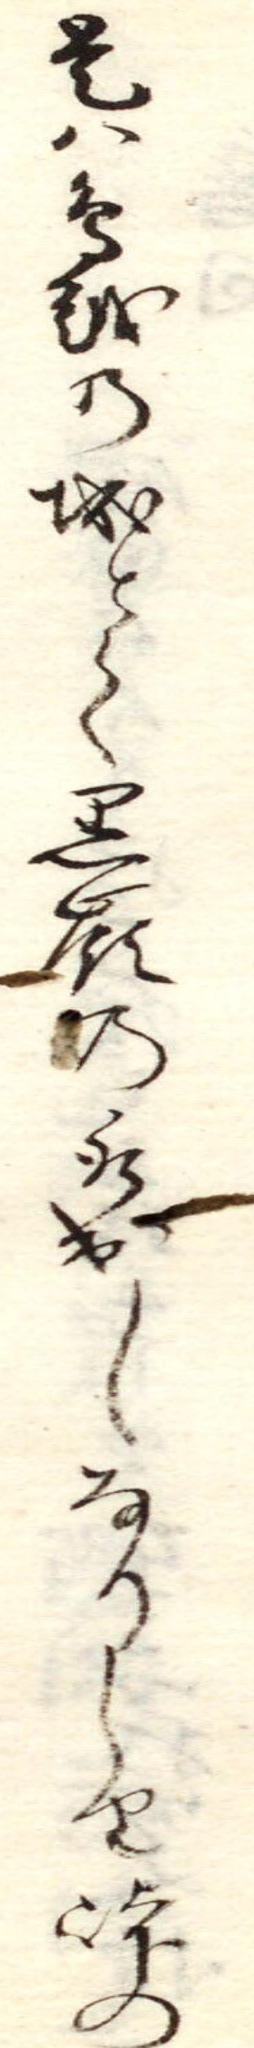是は鳥越の城とて黒嶺の取出しなりし由峠の
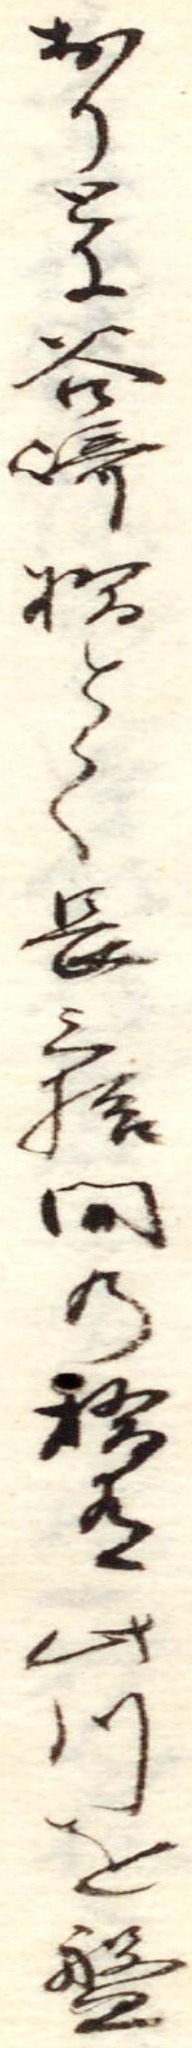おりとに谷崎橋とて長三拾間の橋有此川を盤
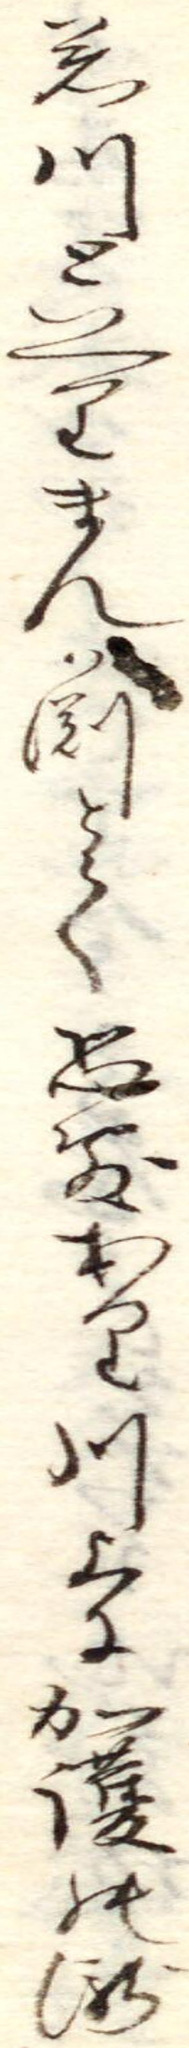若川といへりまんか渕とて恐敷あり川上に加護の瀧
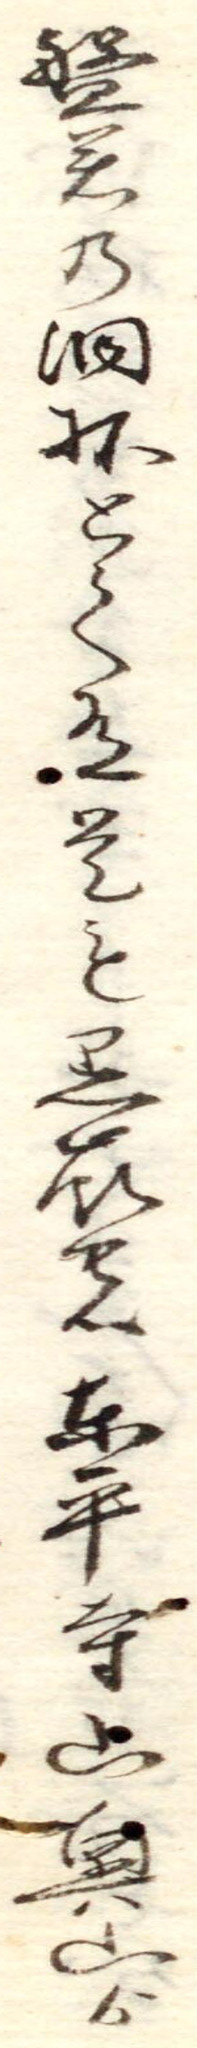盤若の洞抔とて有是も黒嶺の東平寺山奥山ゟ
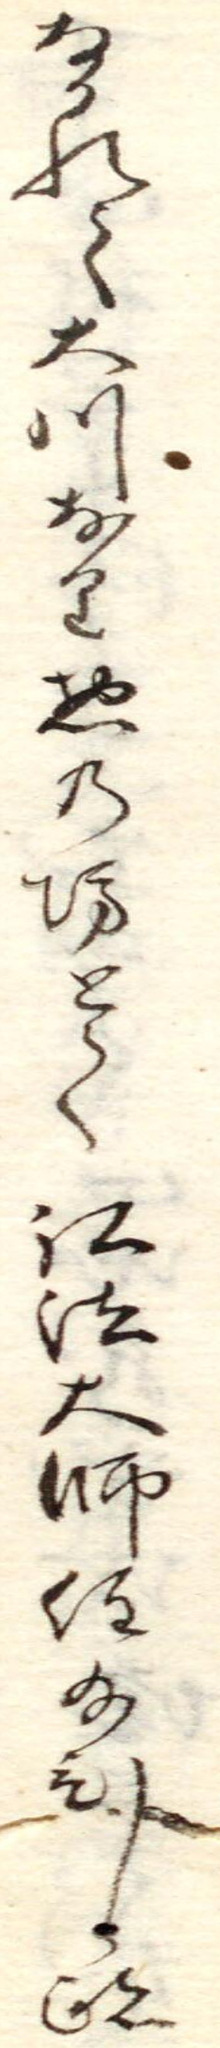なかれて大川なり惣の坊とて弘法大師住給ひし跡
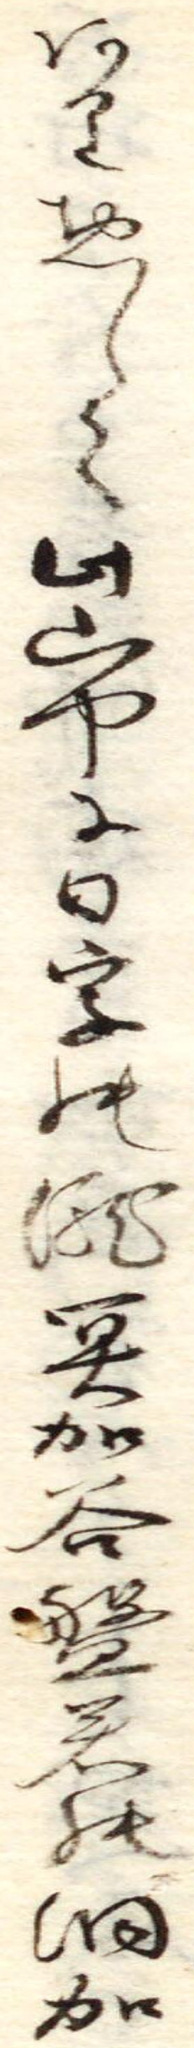あり惣して此山中に日字の瀧冥加谷盤若の洞加
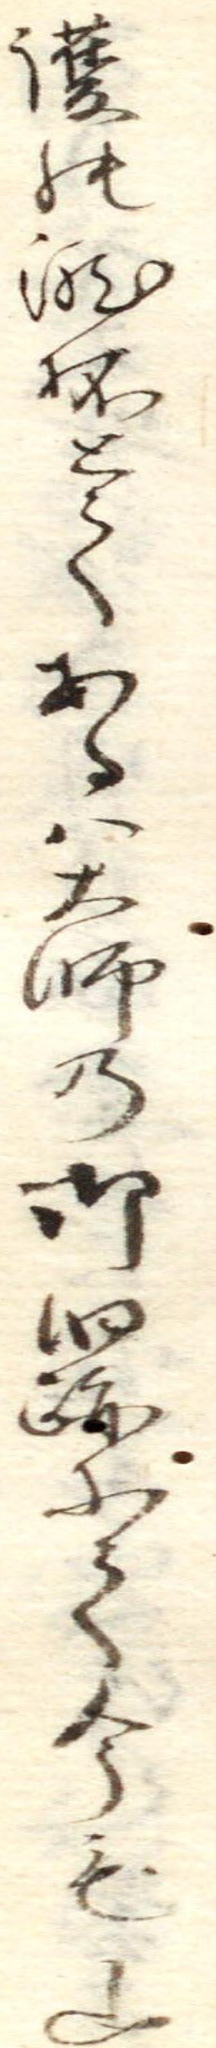護の瀧抔とてあるは大師の御旧跡にて今も山

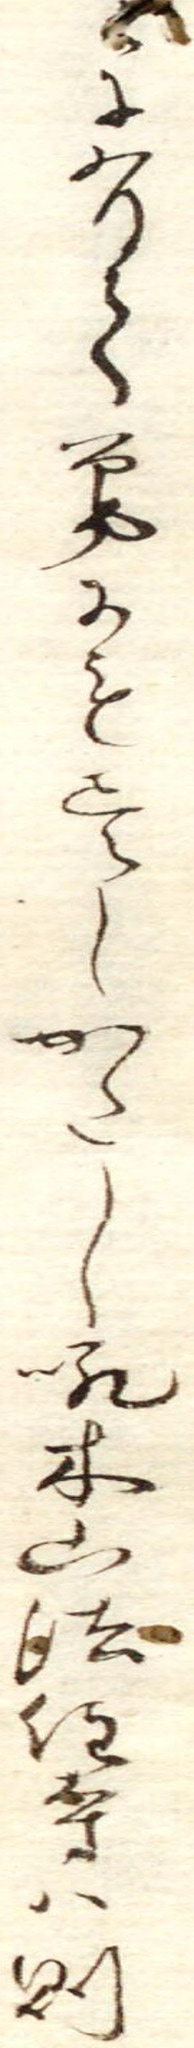々に有て筆にも尽しかたし吼木山法住寺は則
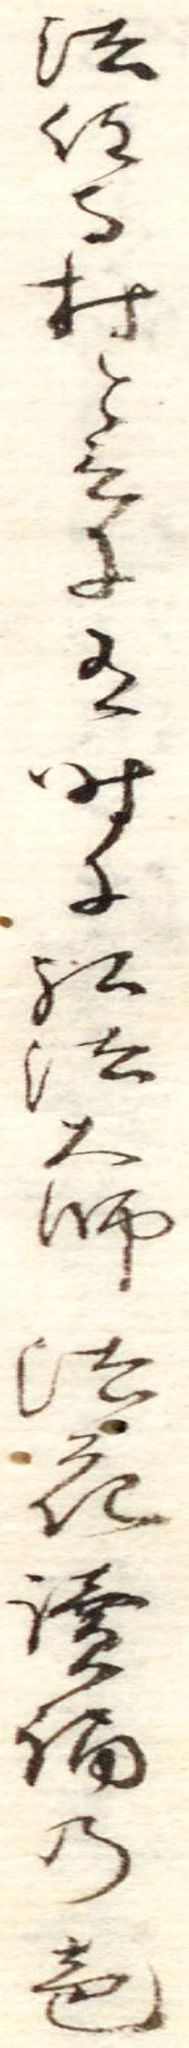法住寺村と云に有時に弘法大師法華読誦の声
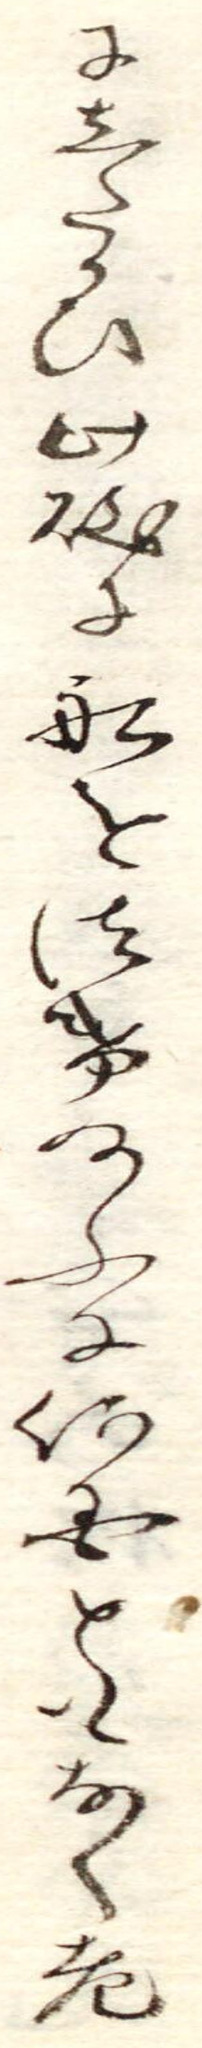にしたかひ此磯に船をつけ給ふに何国ともなく老
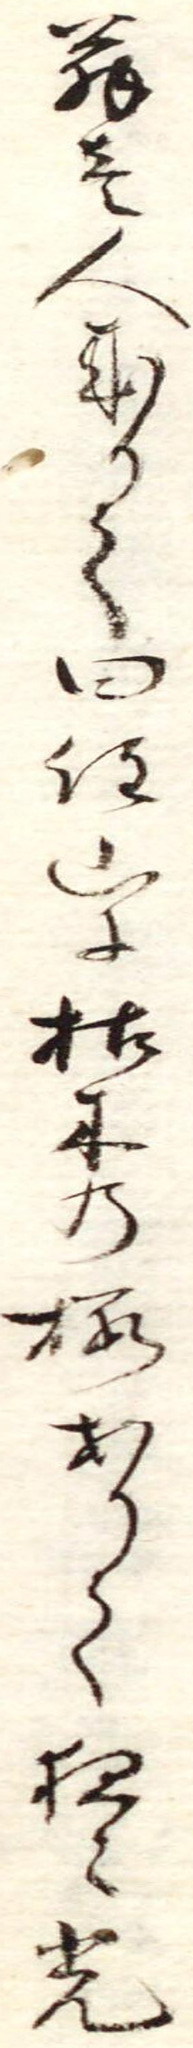翁壱人来たりて曰住山に枯木の桜ありて夜々光
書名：能登名跡誌
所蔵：Ishikawa Prefectural Library
